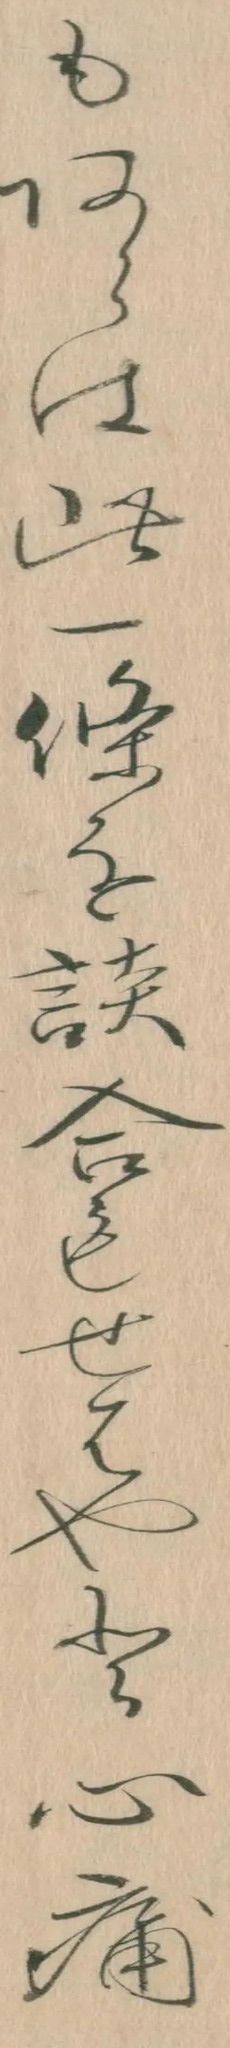もあらは此一条を談合もせはやと心痛
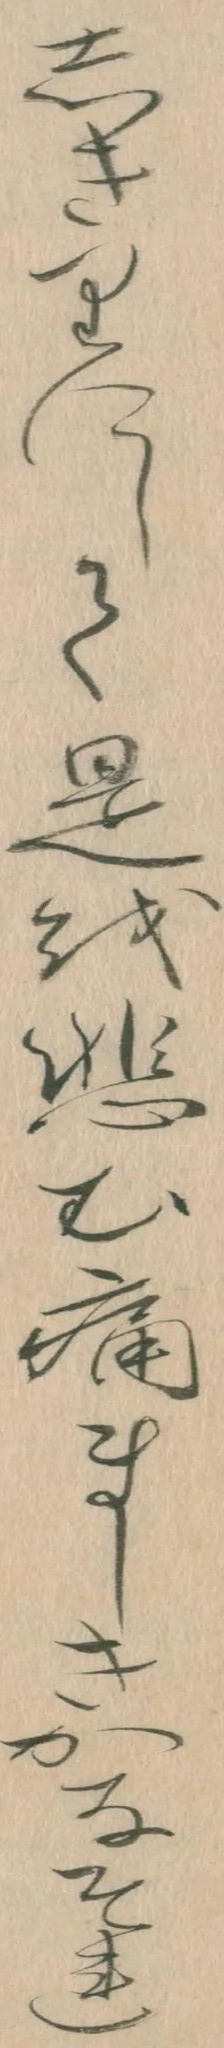しきりにして是を悲む痛ましきかなそれ
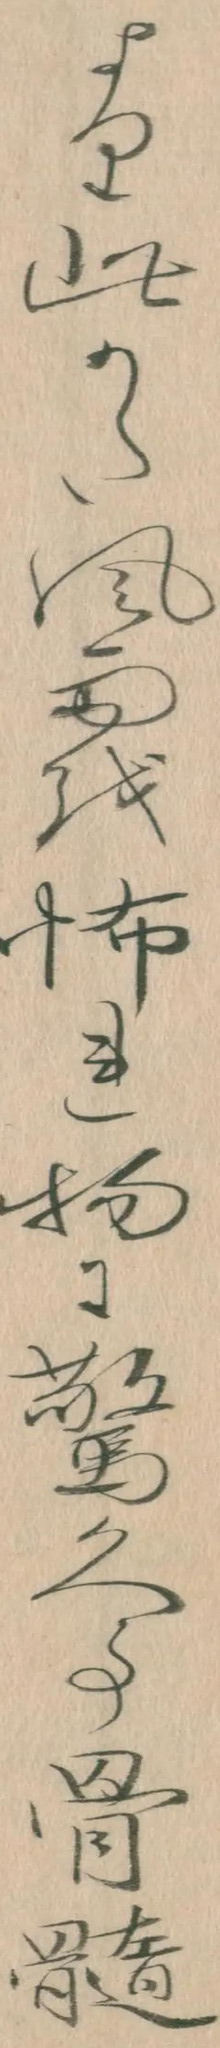より此かた風雨を怖れ物に驚く事骨髄
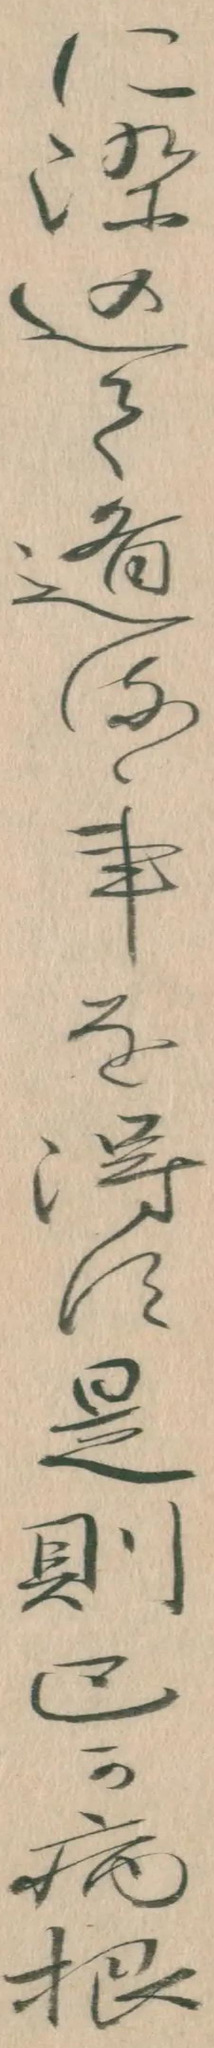に染込て遁るゝ事を得す是則己か病根
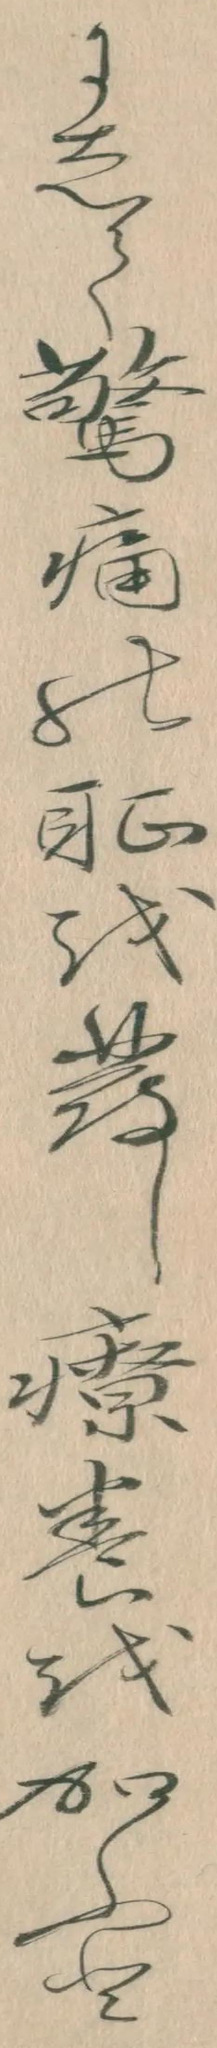にして驚痛の恥を発し療養を加ふと
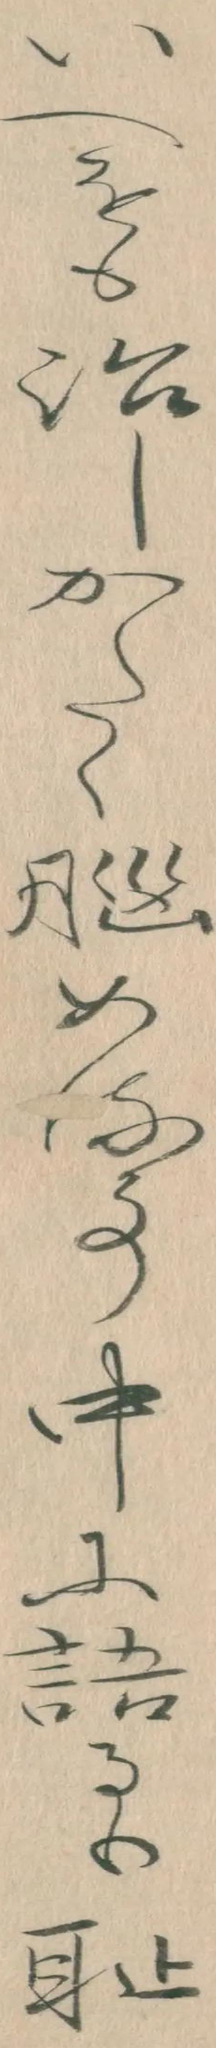いへとも治しかたく脳める事中に語るも恥
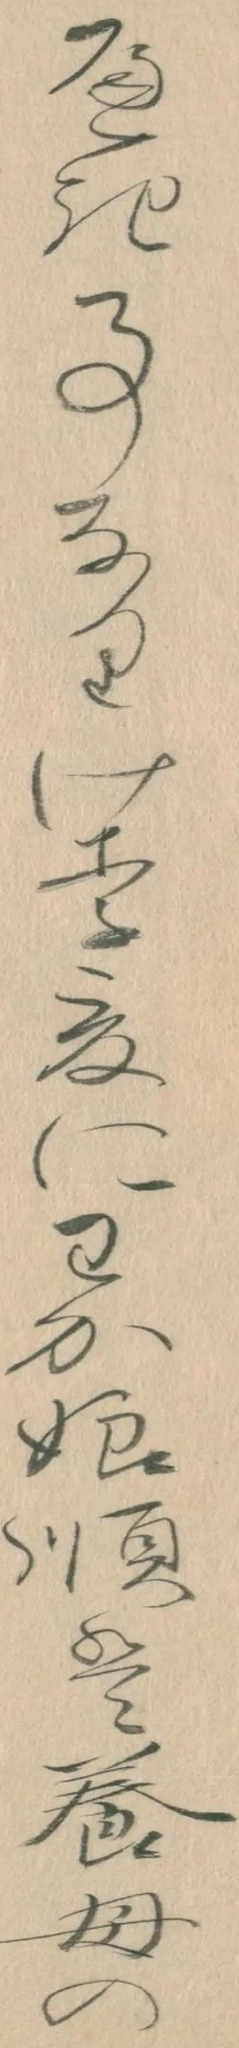へき事なりけり爰に己か娘順は養母の

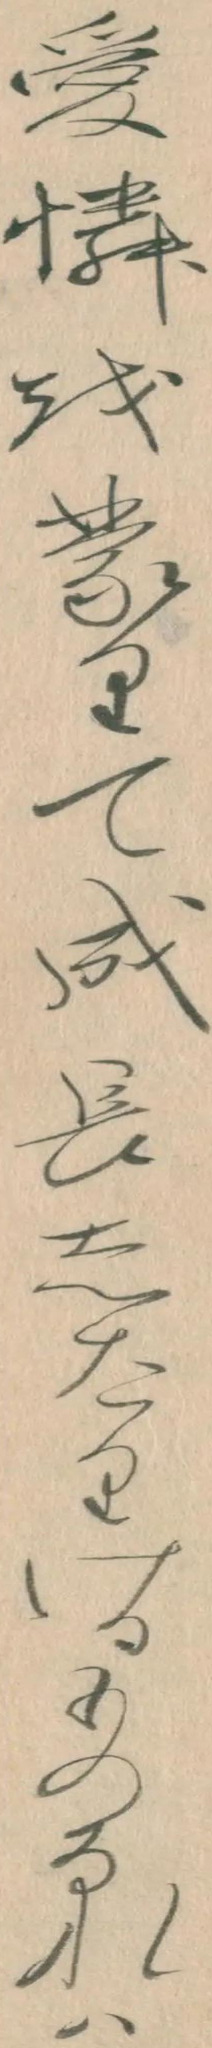愛憐を蒙りて成長したりけるものなれは
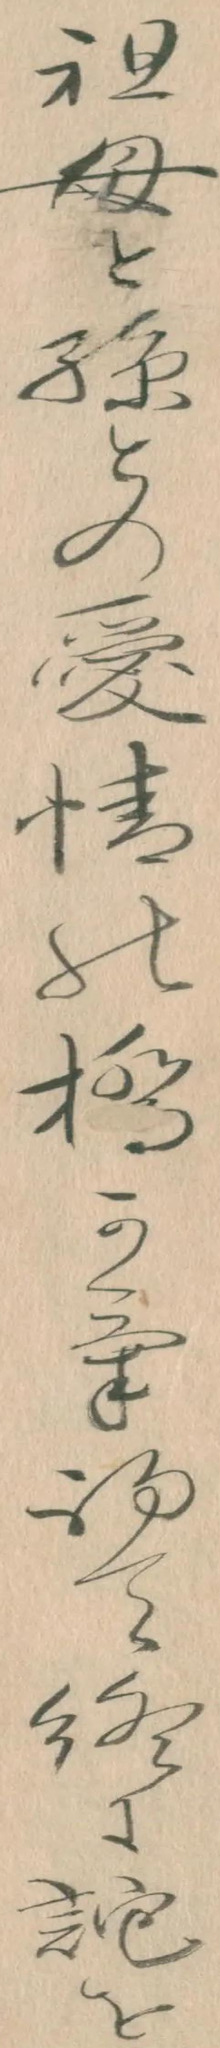祖母と孫との愛情の橋かけ初て終に詫を
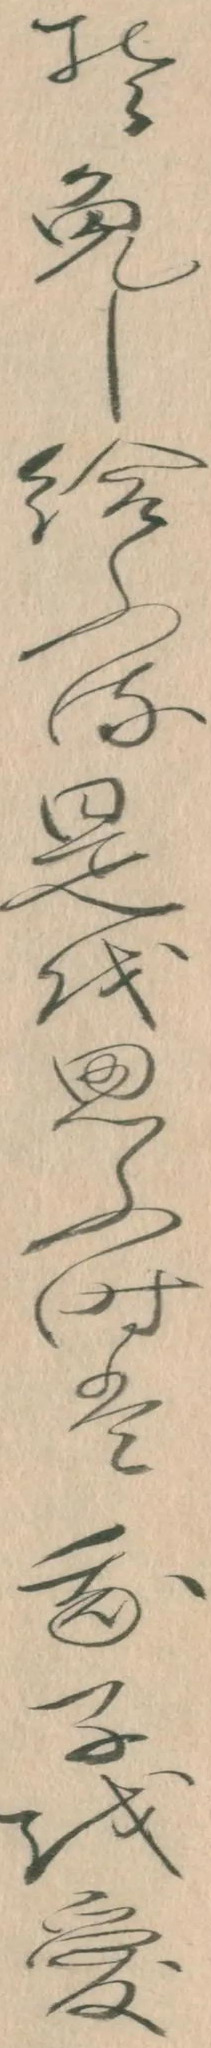そ免し給ふる是を思ふ時は我子を愛
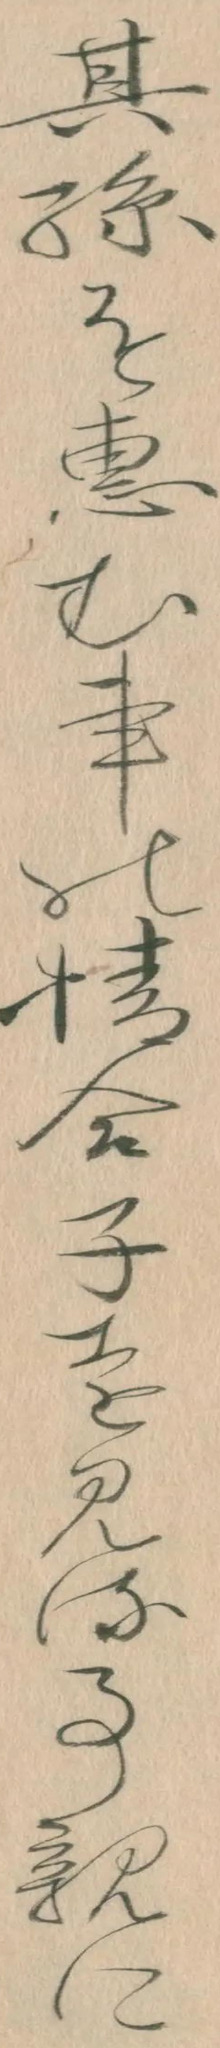其孫を恵む事の情合子を見る事親に
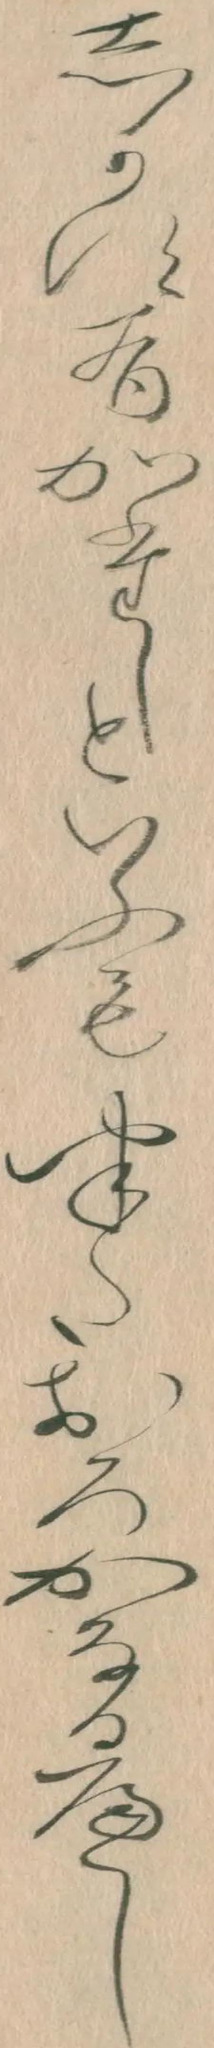しかす有かたしといふもまたおろかなるへし
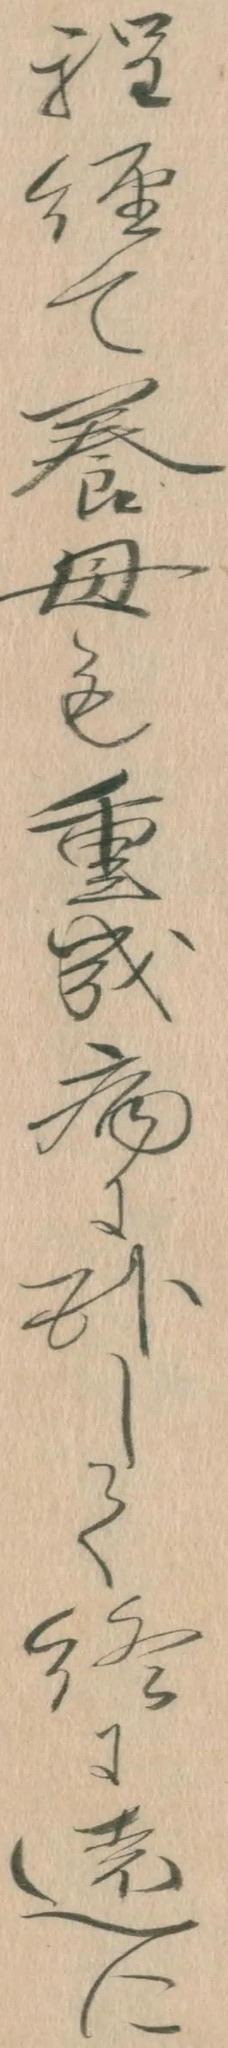程経て養母も重き病に臥して終に遠に
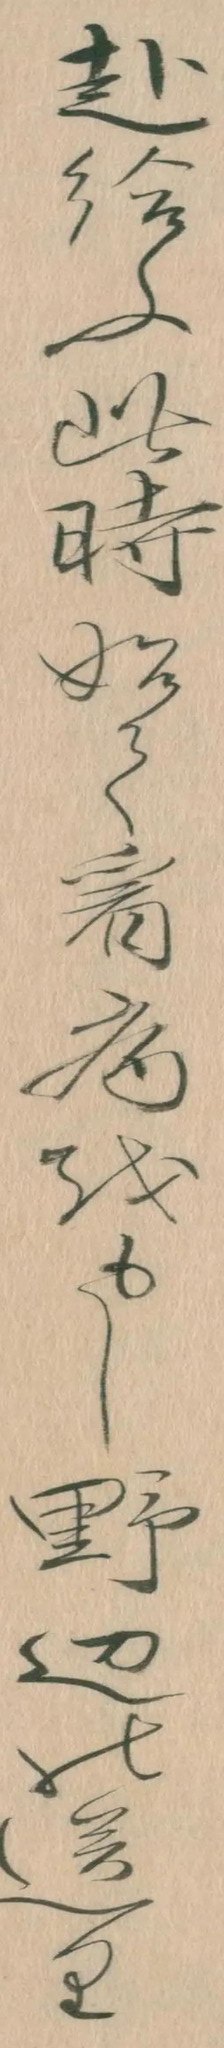赴給ふ此時始て看病をもし野辺の送り
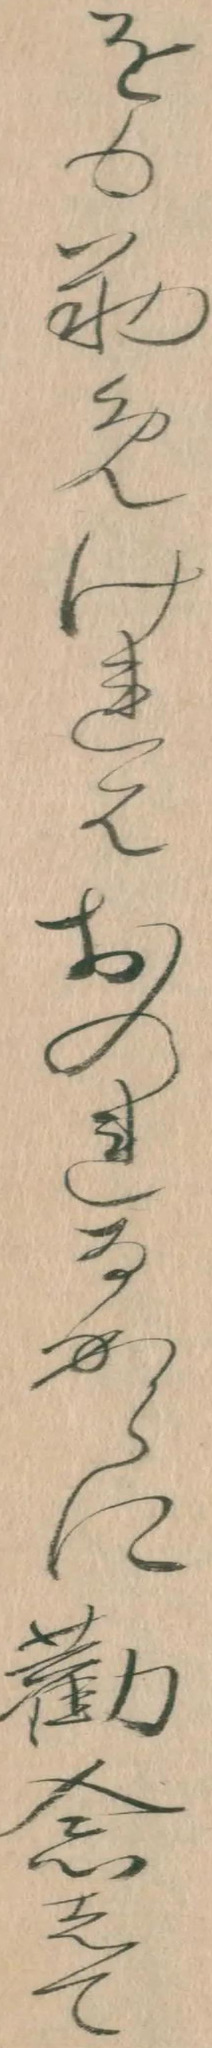をも勤めけれはおのれなからに勧念して
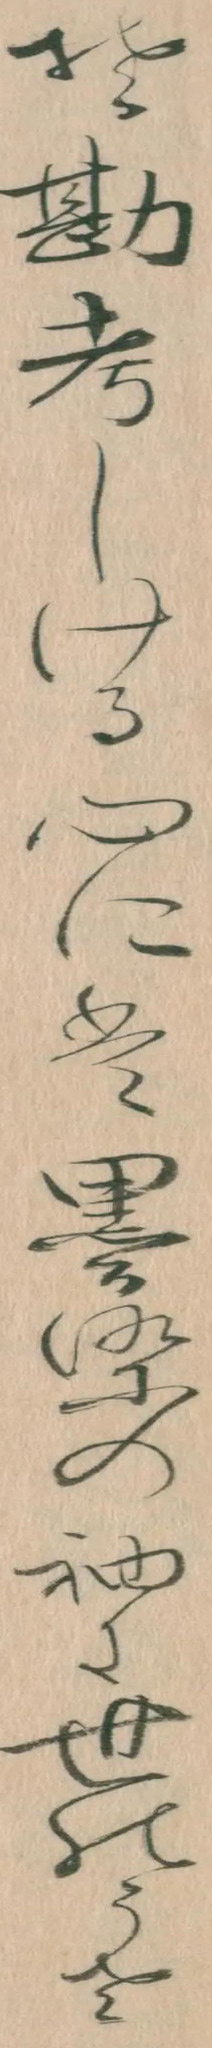そ勘考しける心には墨染の袖に世のうさ
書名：俗語之種. [1]
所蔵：国立国会図書館 National Diet Library, JAPAN
